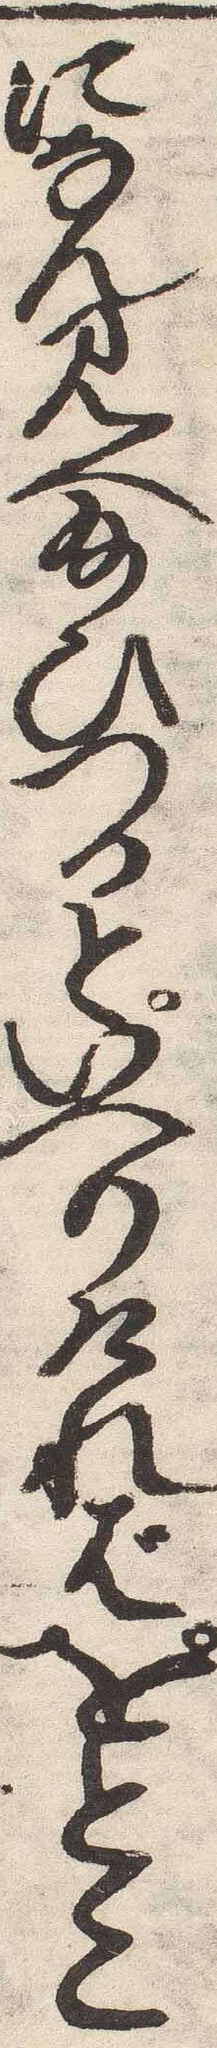になん見へ給ひつると。いへりければ。をとこ
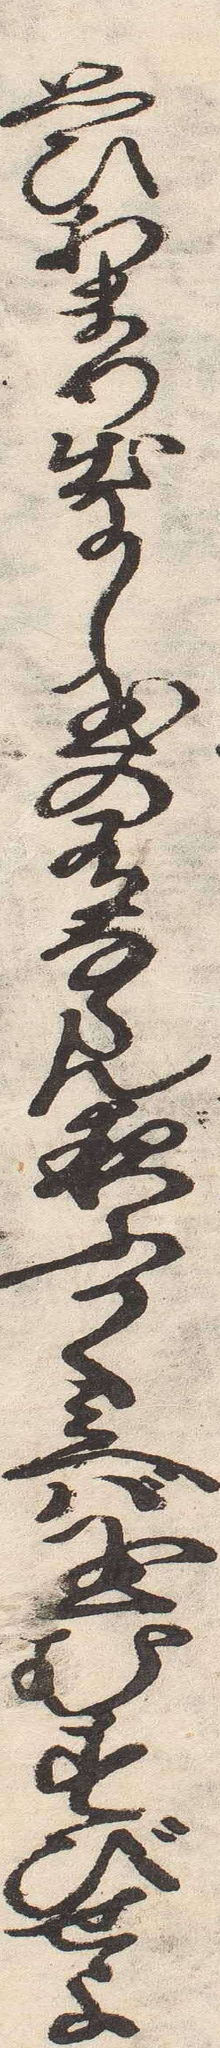思ひあまり出にし玉の有ならん夜ふかくみへば玉むすびせよ
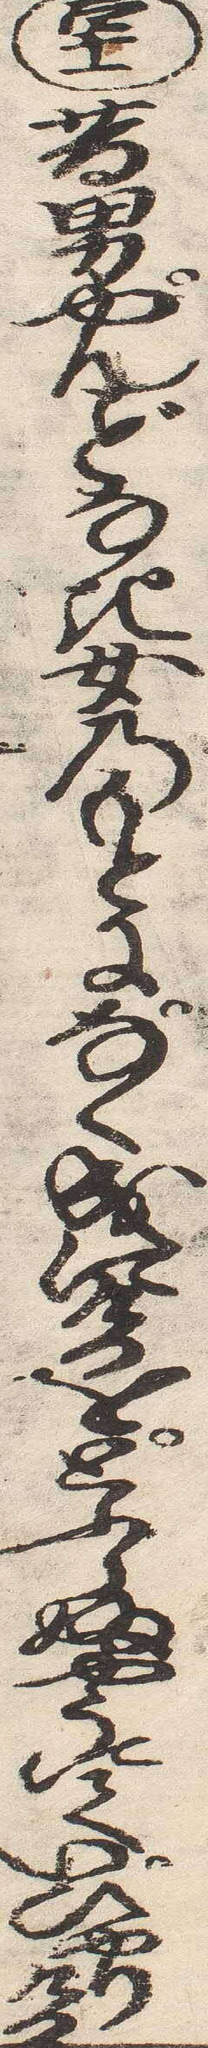百十一昔男。やんごとなき女のもとに。なく成にけるを。とふらふやうにて。いひやりける
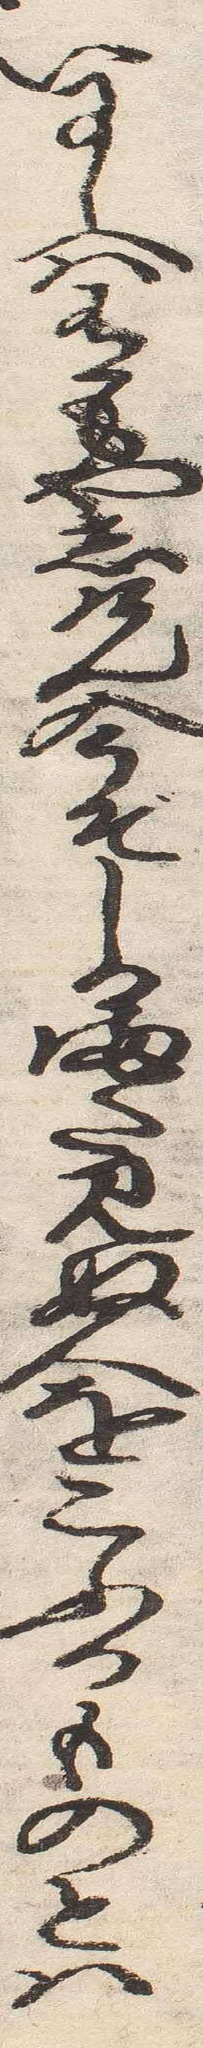いにしへは有もやしけん今ぞしるまた見ぬ人をこふるものとは
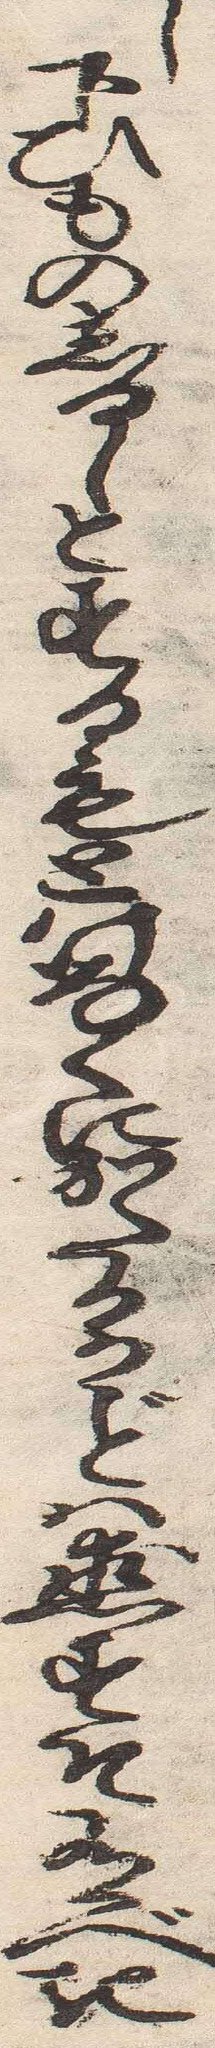下ひものしるしとするもとけなくにかたるかごとは恋すそ有べき
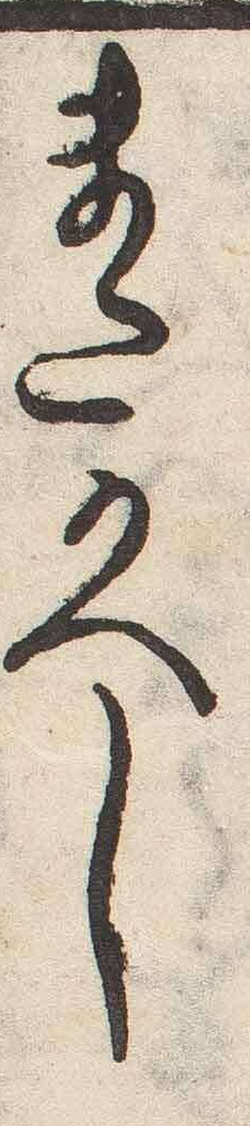またかへし
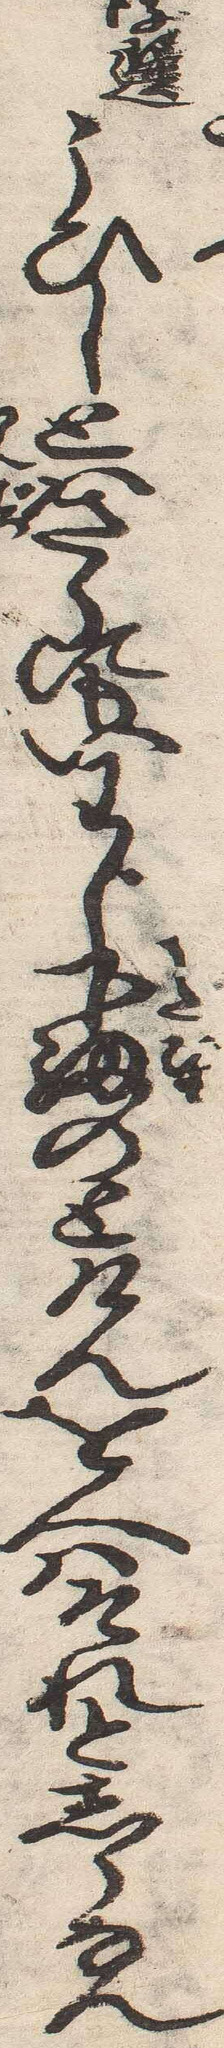後選こひしとはさらにもいわじ下紐のとけんを人はそれとしらなん
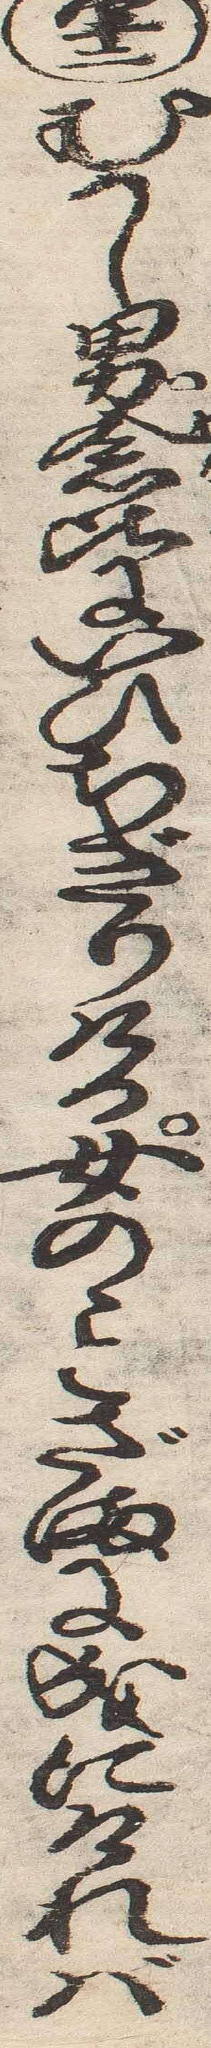百十二むかし男。念比にいひちぎりける。女のことざまに成にければ
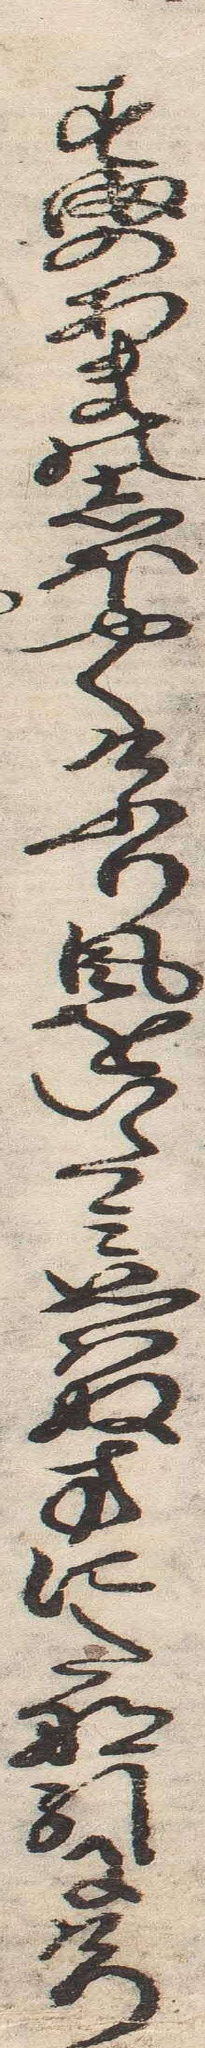同すまのあまのしほやくけふり風をいたみ思はぬ方にたな引にけり
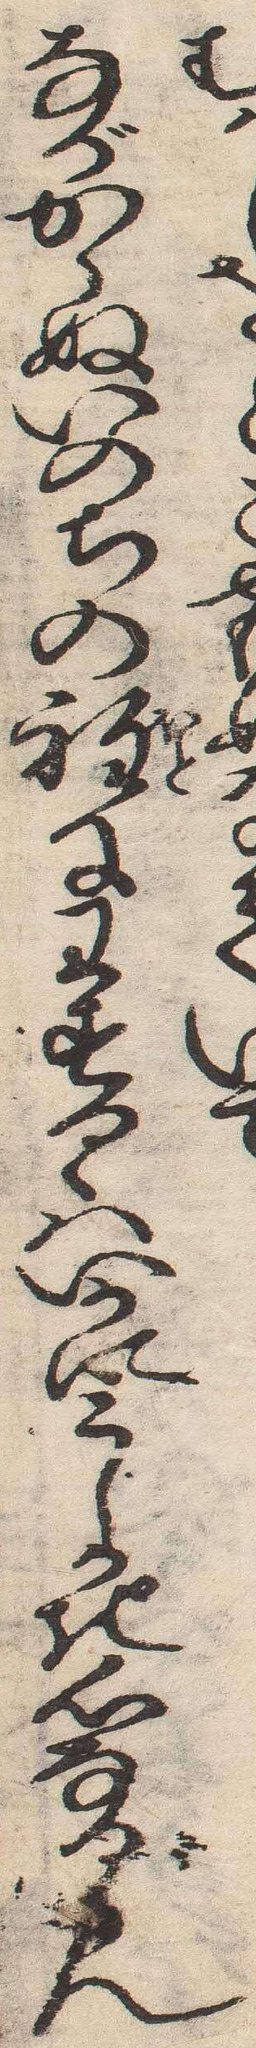ながからぬいのちの程にわするゝはいかにみしかき心なるらん

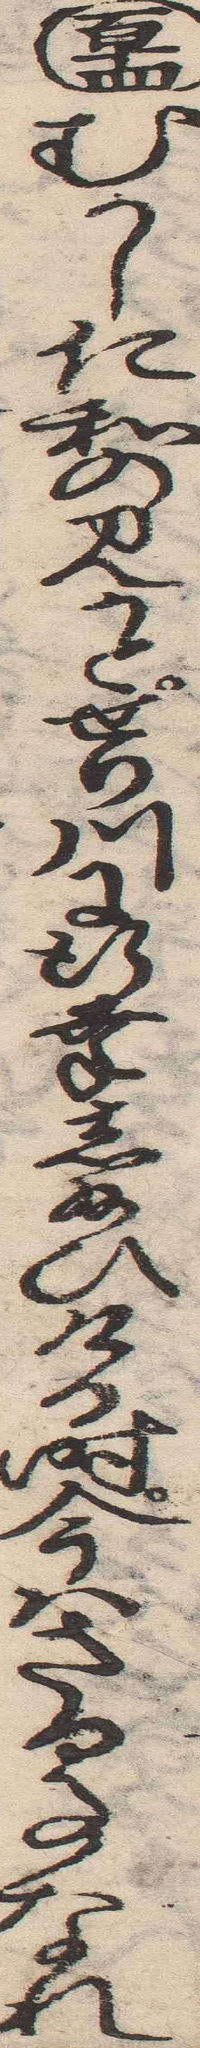百十四むかし仁和のみかと。せり川に行幸し給ひける時。今はさる事なれ
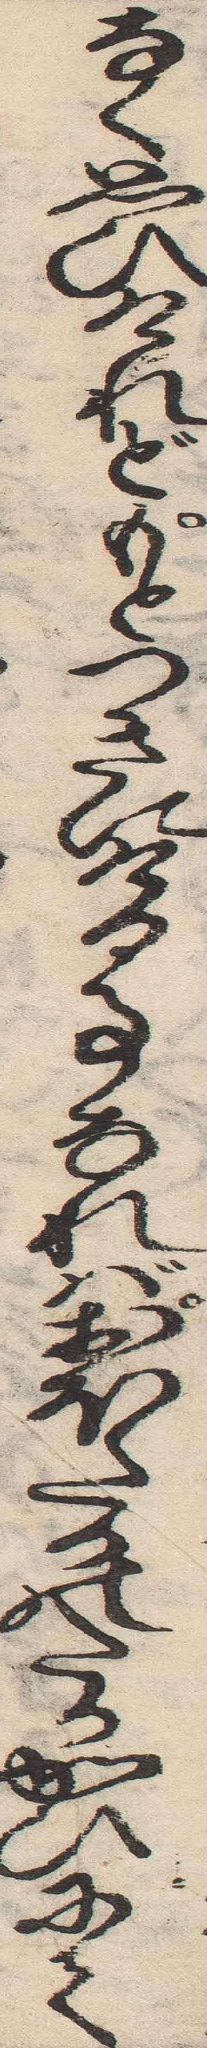なく思ひけれど。もとつきにける事なれば。おほたかのたかかひにて
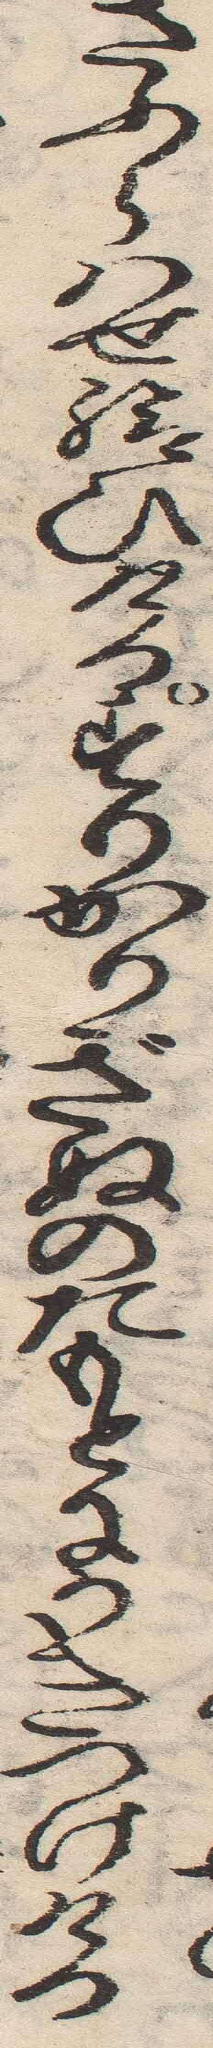さふらはせ給ひける。すりかりぎぬのたもとにかきつけける
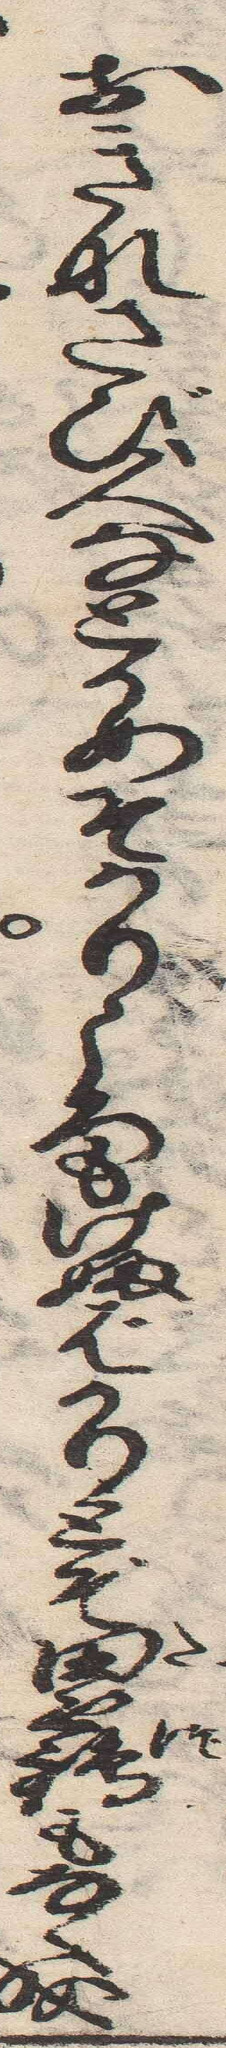おきなさび人なとかめそかりころもけふばかりとぞ田鶴もなく成
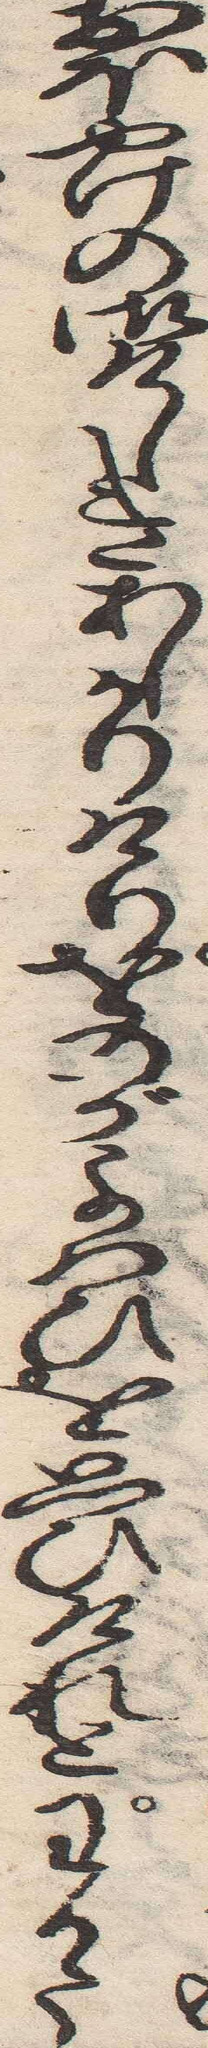おほやけの御けしきあしかりけり。をのがよはひを思ひけれと。わかゝら
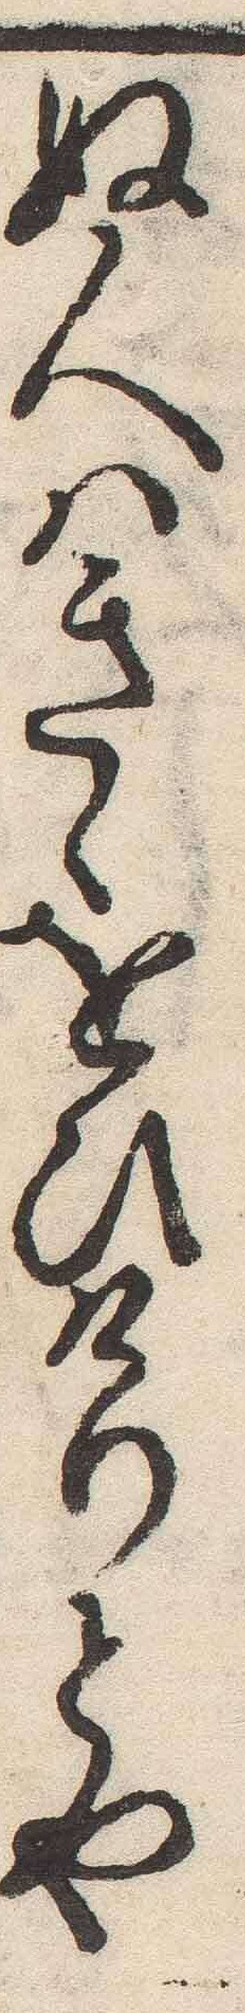ぬ人はきゝをひけりとや
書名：伊勢物語
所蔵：東京学芸大学附属図書館 国文学研究資料館
